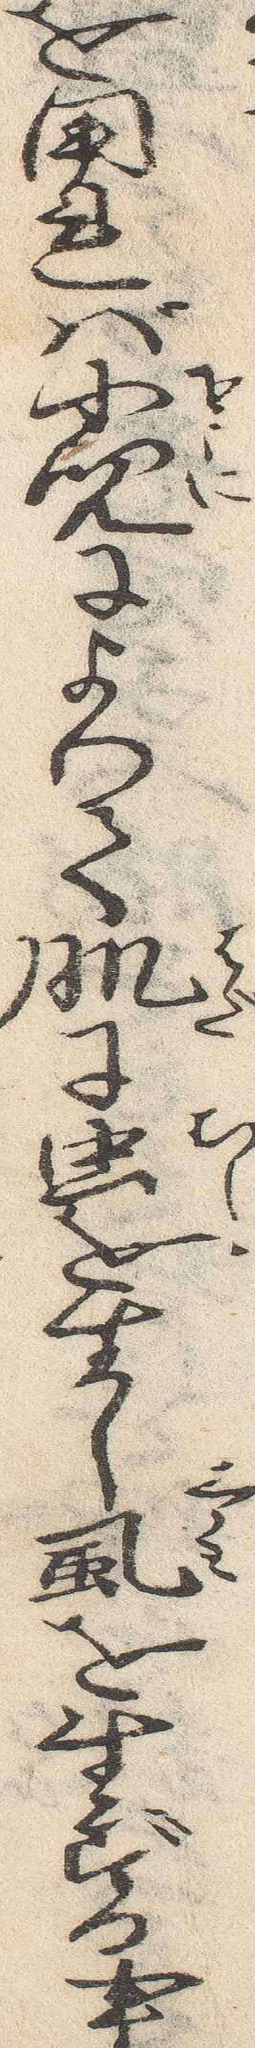を用れば小児によりて肌に虫を生し虱を生ずる事
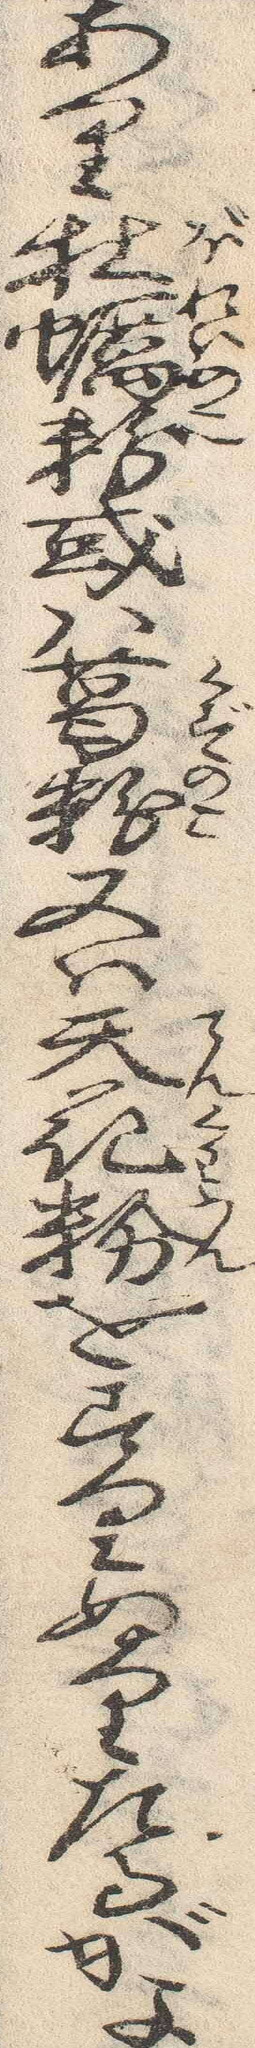あり牡蠣粉或は葛粉又は天花粉をすりぬりたるがよ
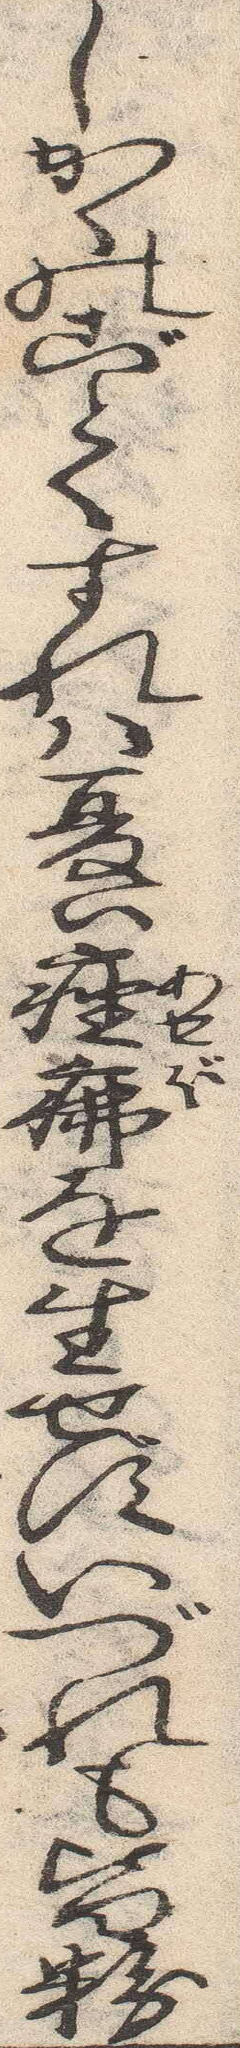しかくのごとくすれは夏は痤疿を生せずいづれも皆粉
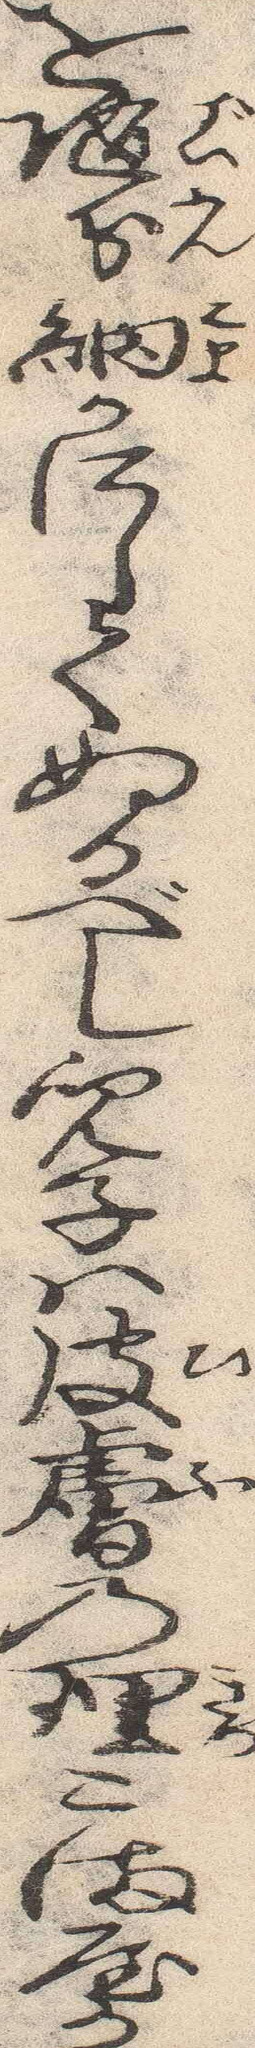を随分細かにしてぬるべし児子は皮膚の理こまやか
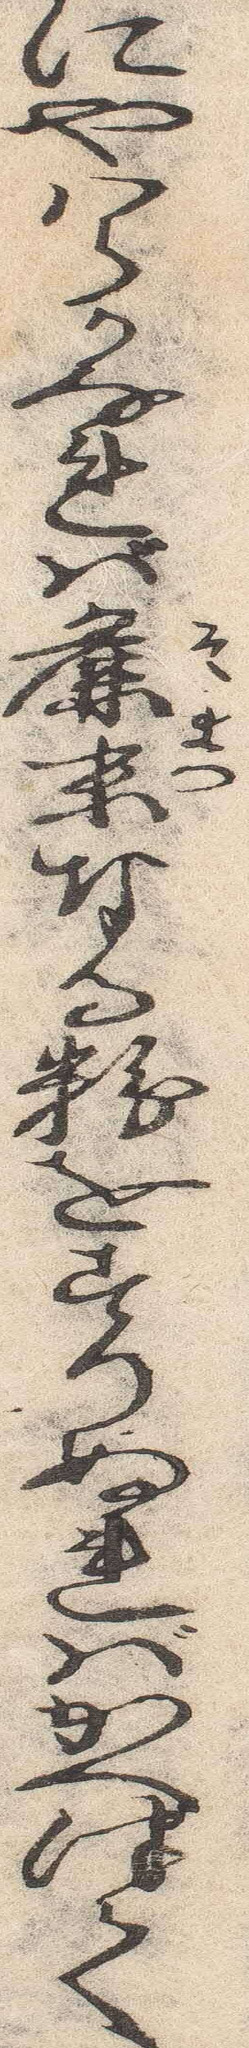にやはらかなれば麁末なる粉をすりぬればかへつて
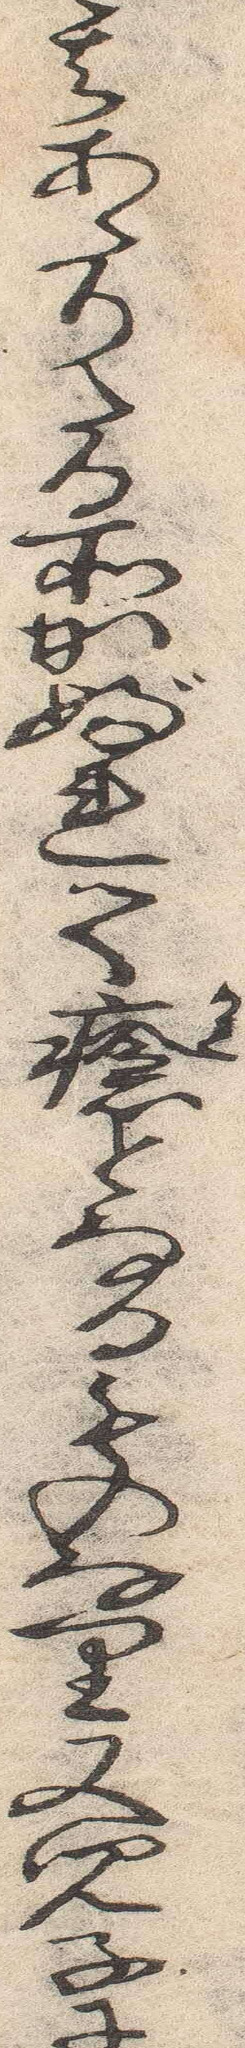其あたりたる所かぶれて瘡となるものなり又児子に
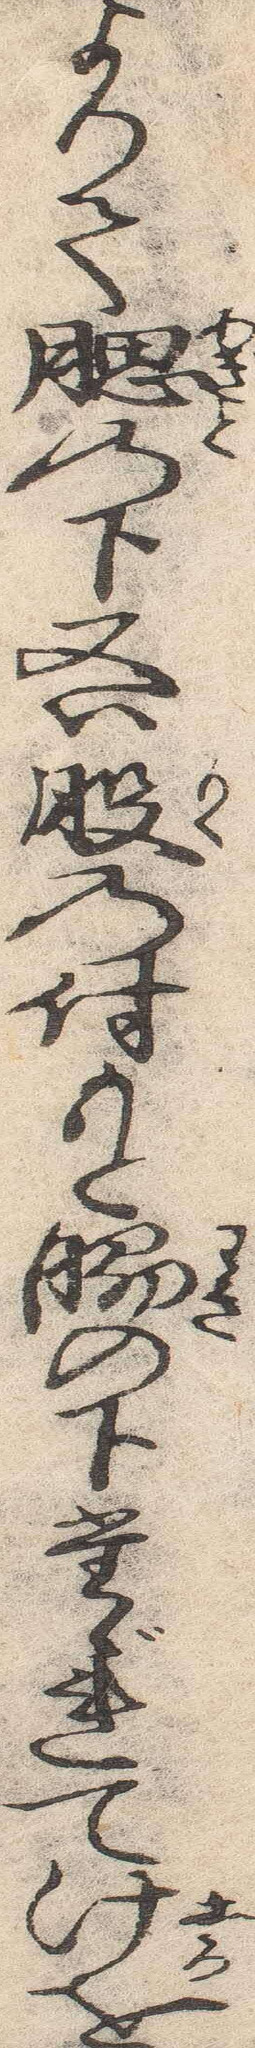よりて腮の下又は股の付もと脇の下たゞれて汁を
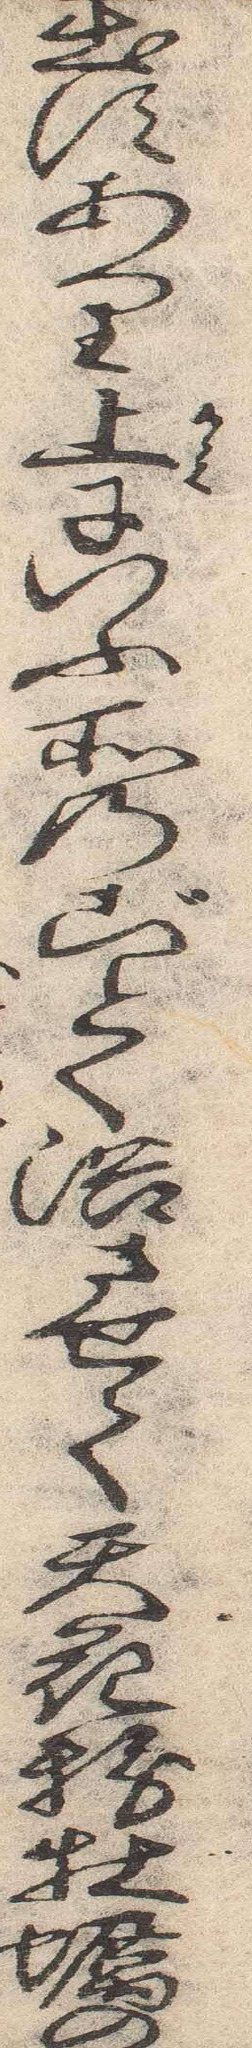出すあり上にいふ所のごとく浴させて天花粉牡蠣の
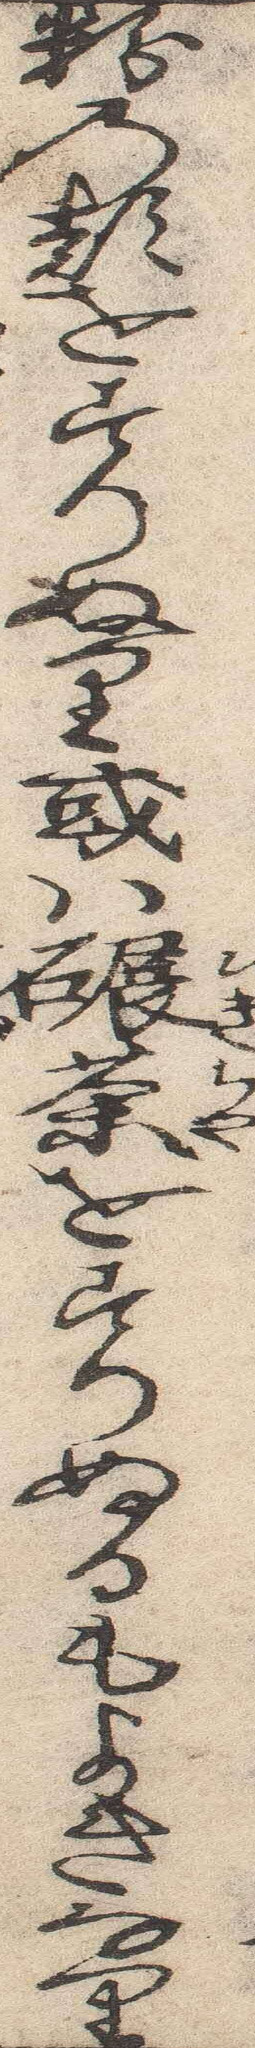粉の類をすりぬり或は碾茶をすりぬるもよきなり
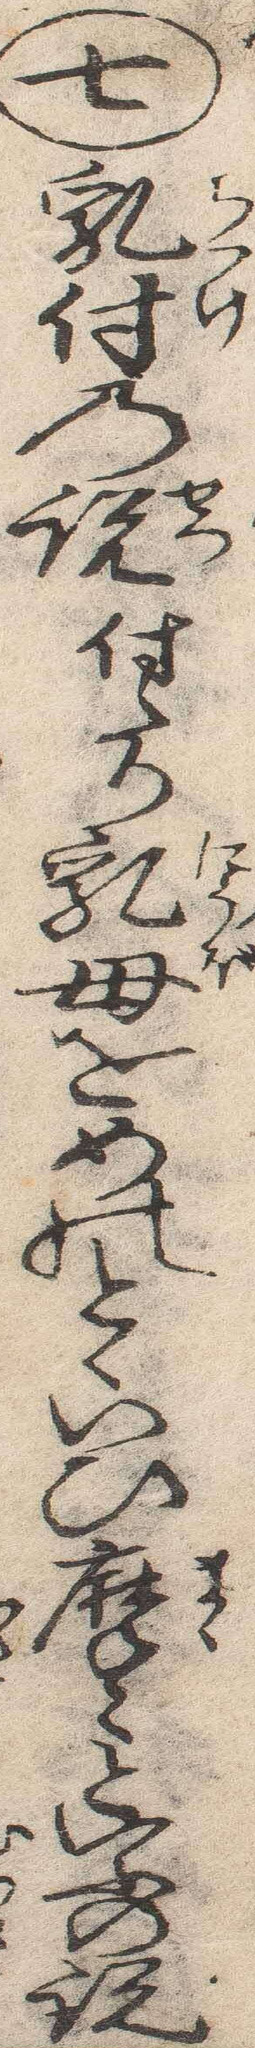㊆乳付の説付たり乳母をめのとゝいひ摩〻といふの説
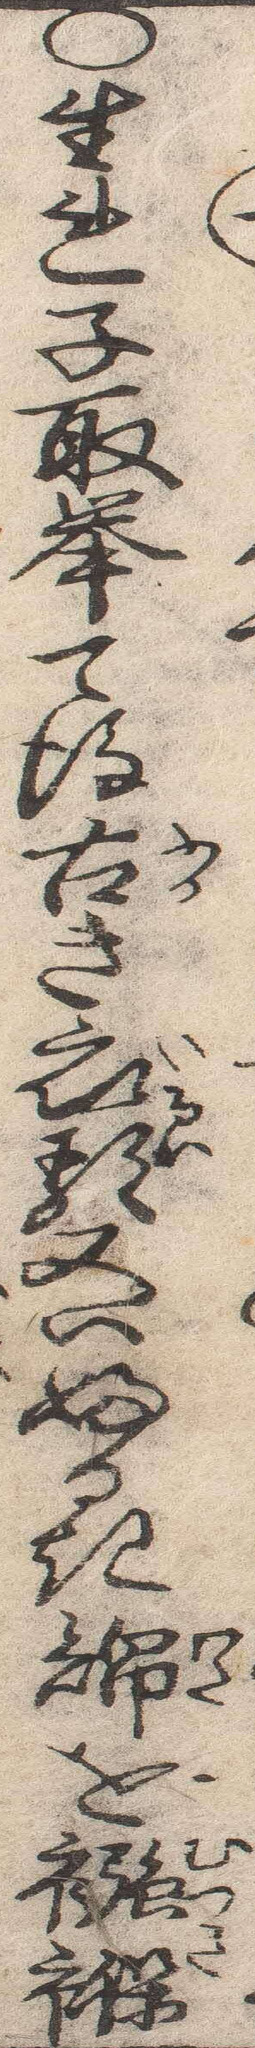◯生れ子取擧て後古き衣類又はふるき綿を襁褓
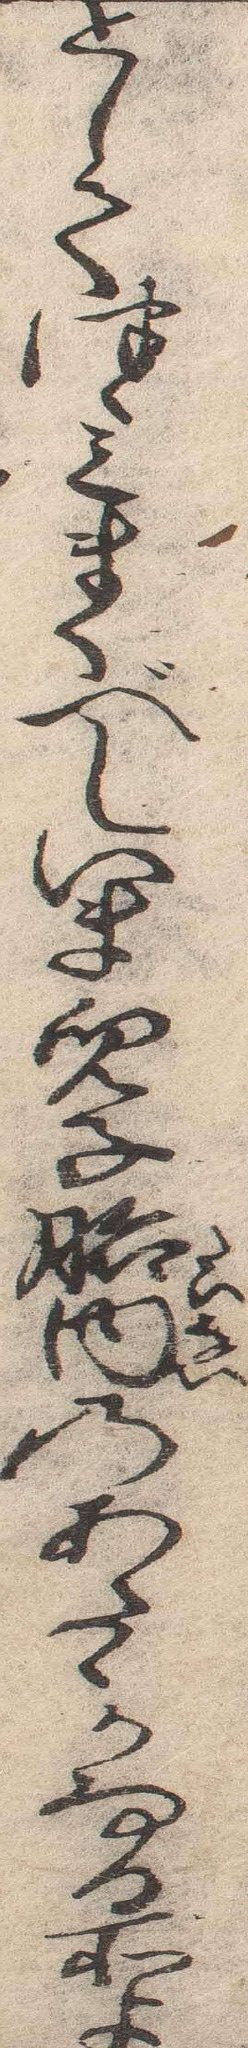としてつゝみまくべしいま児子胎内のあたたかなる所よ
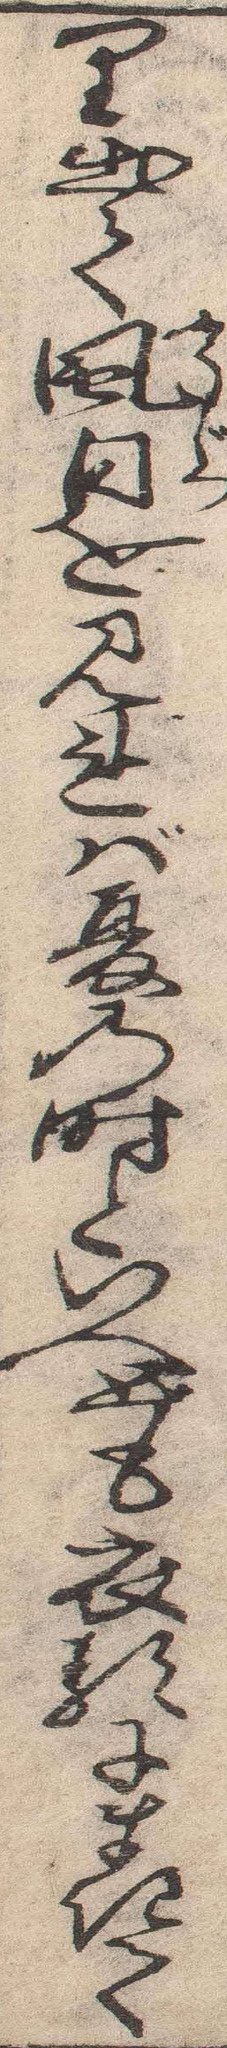り出て風日を見れば夏の時といへども衣類にまきて

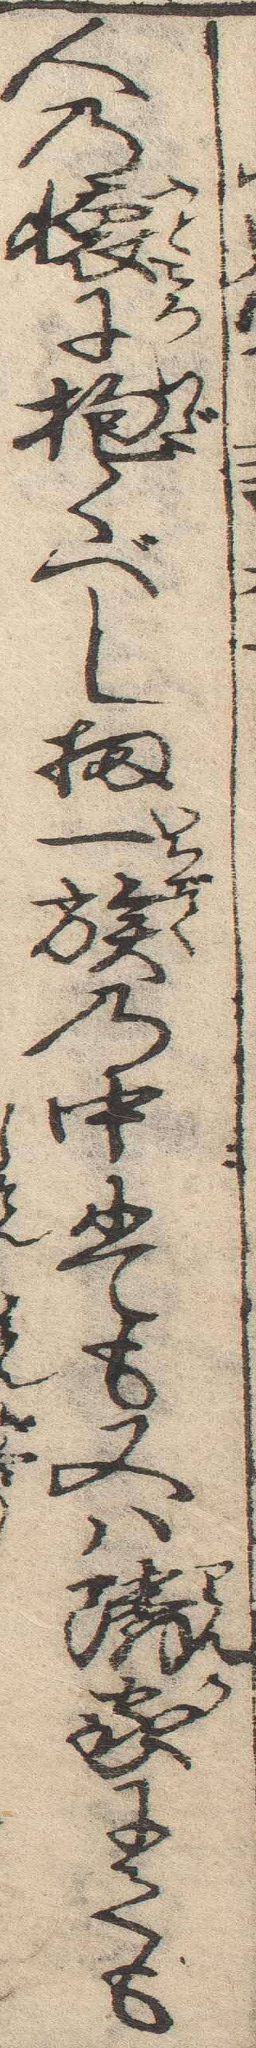人の懐に抱くべし扨一族の中にても又は隣家にても
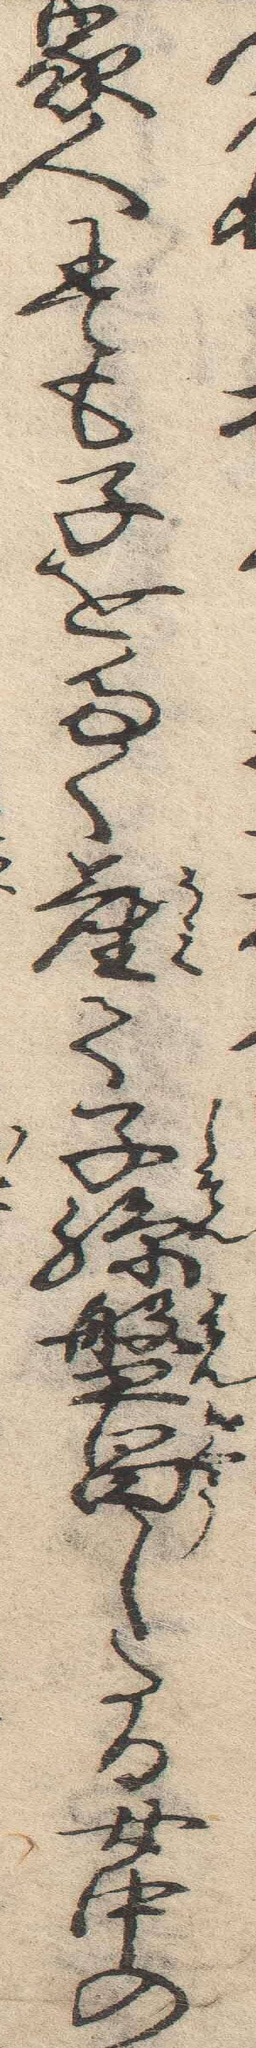家人にても子を多く産て子孫盤昌したる女中の
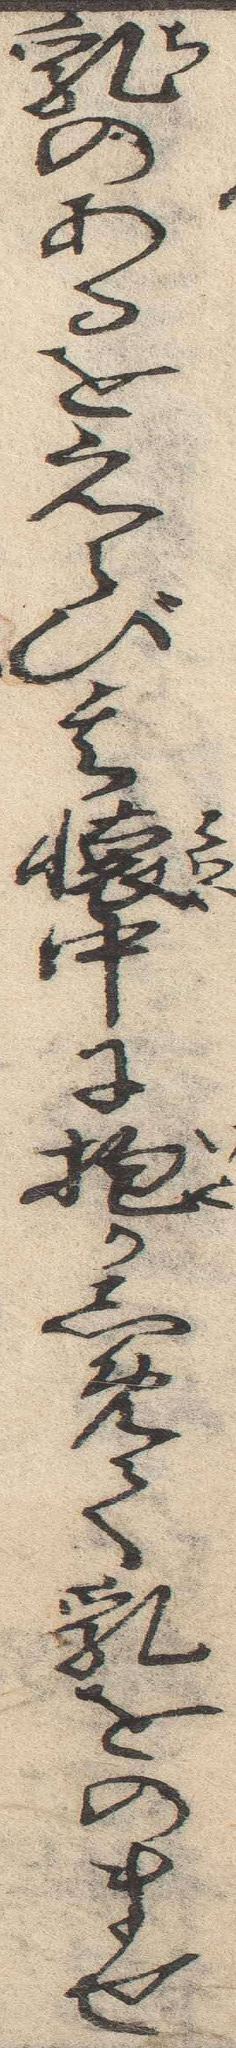乳のあるをえらび其懐中に抱かしめて乳をのませ
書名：小児必用養育草
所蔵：東京学芸大学附属図書館 国文学研究資料館
